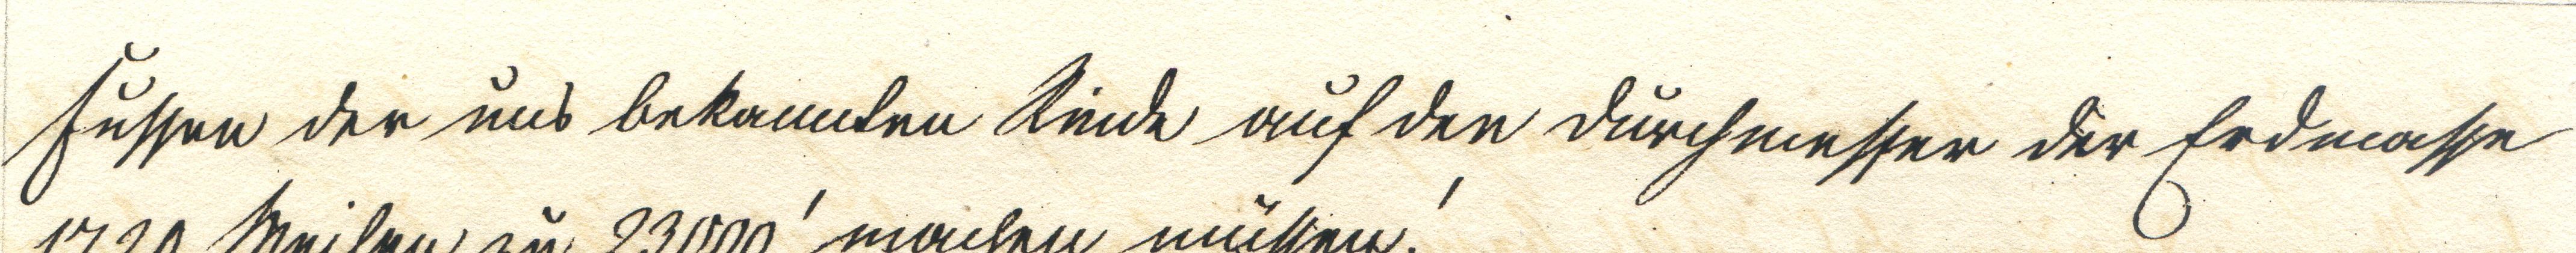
Fussen der uns bekannten Rinde auf den Durchmesser der Erdmasse
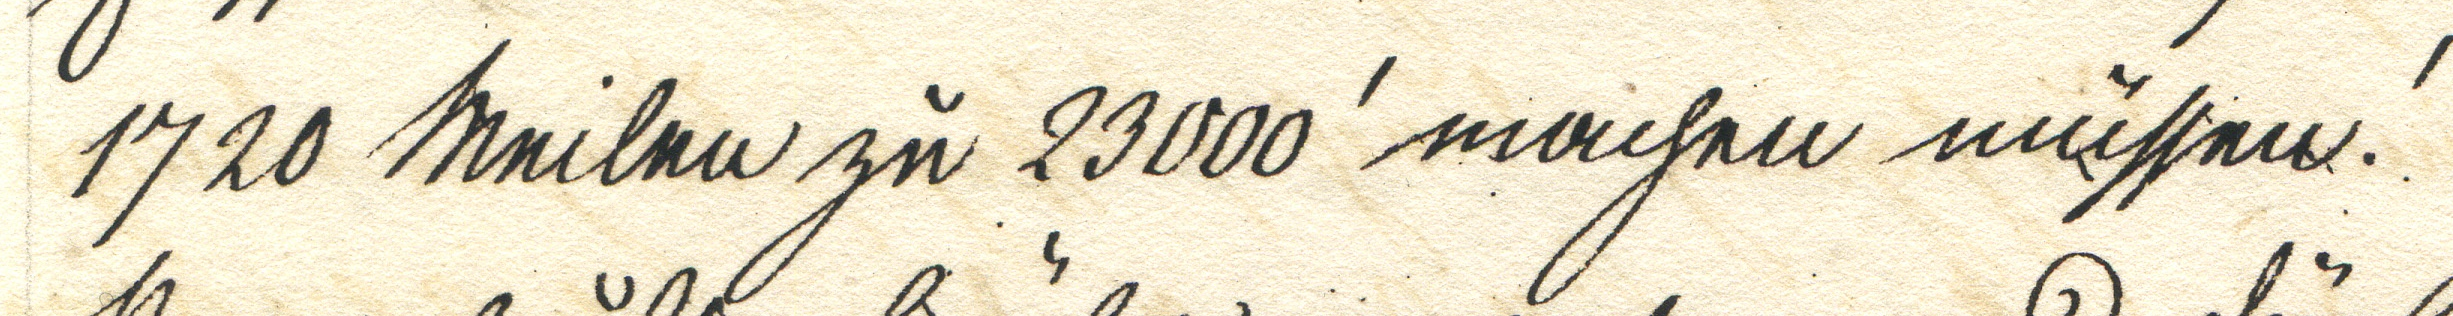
1720 Meilen zu 23000' machen müssen!
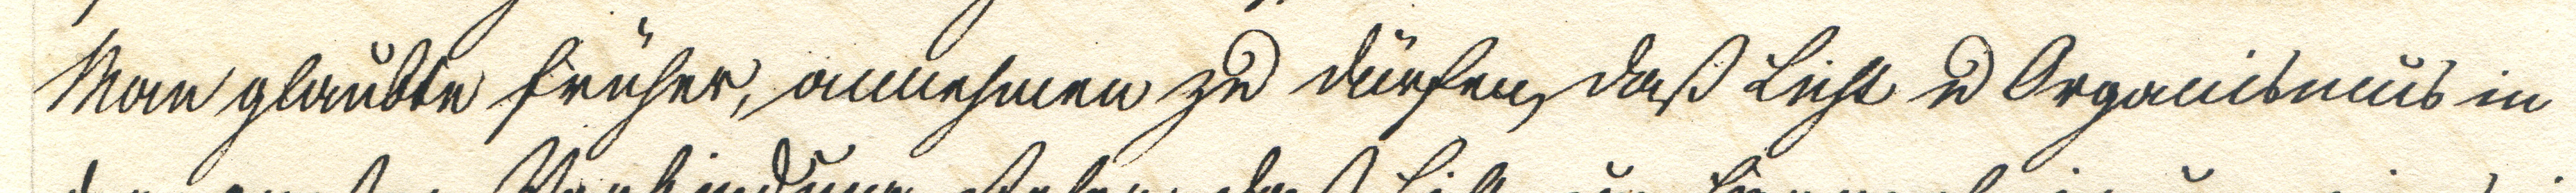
Man glaubte früher, annehmen zu dürfen, daß Licht u Organismus in
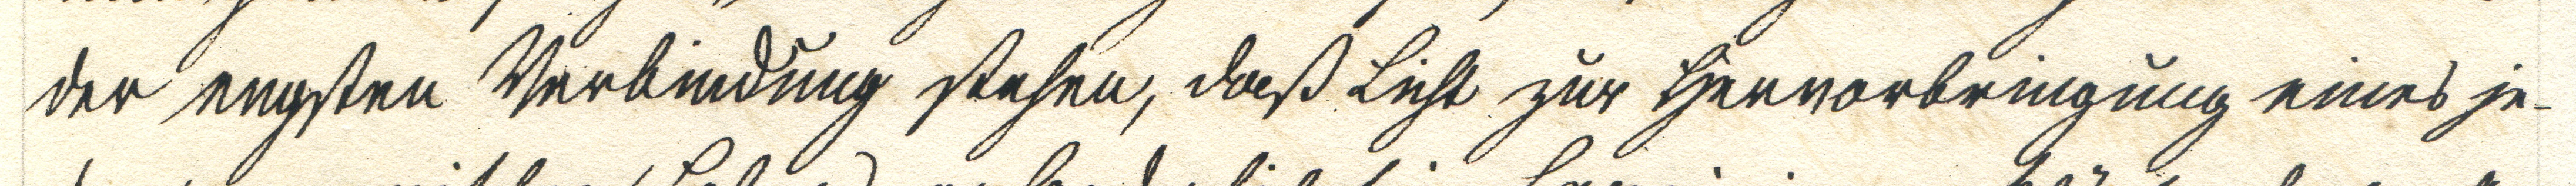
der engsten Verbindung stehen, daß Licht zur Hervorbringung eines je-
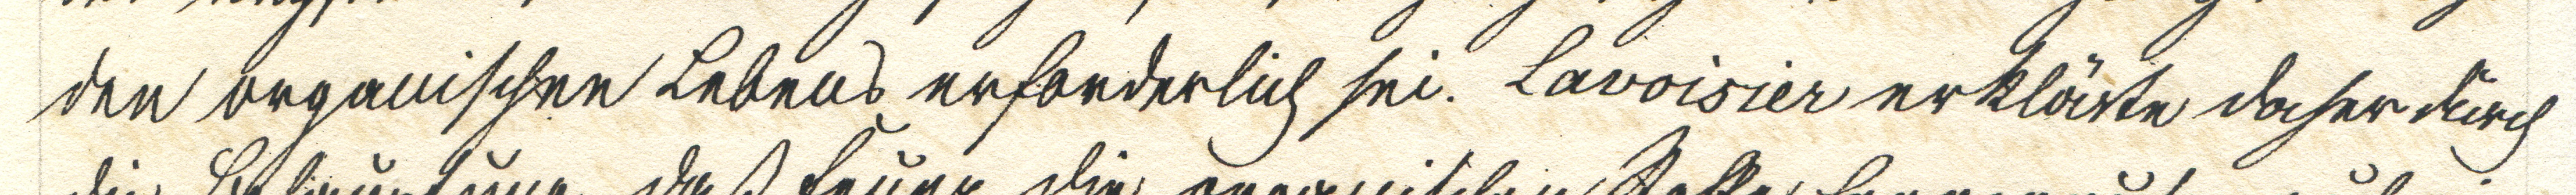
den organischen Lebens erforderlich sei. Lavoisier erklärte daher durch
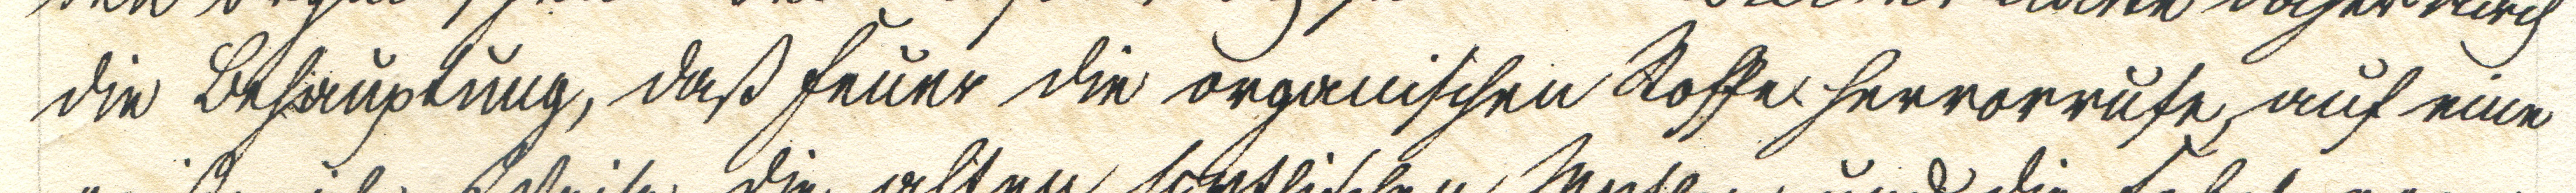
die Behauptung, daß Feuer die organischen Stoffe hervorrufe, auf eine
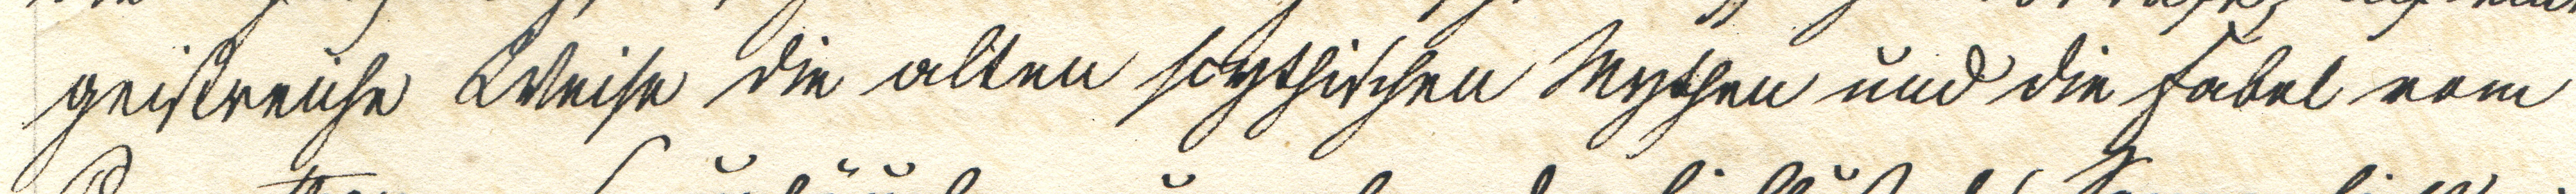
geistreiche Weise die alten scythischen Mythen und die Fabel vom
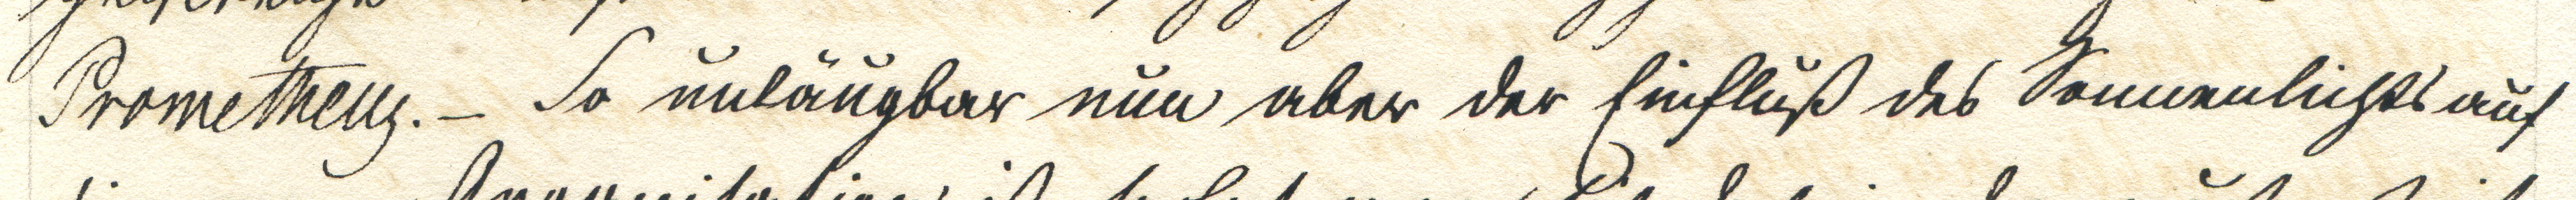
Prometheus. – So unläugbar nun aber der Einfluß des Sonnenlichts auf
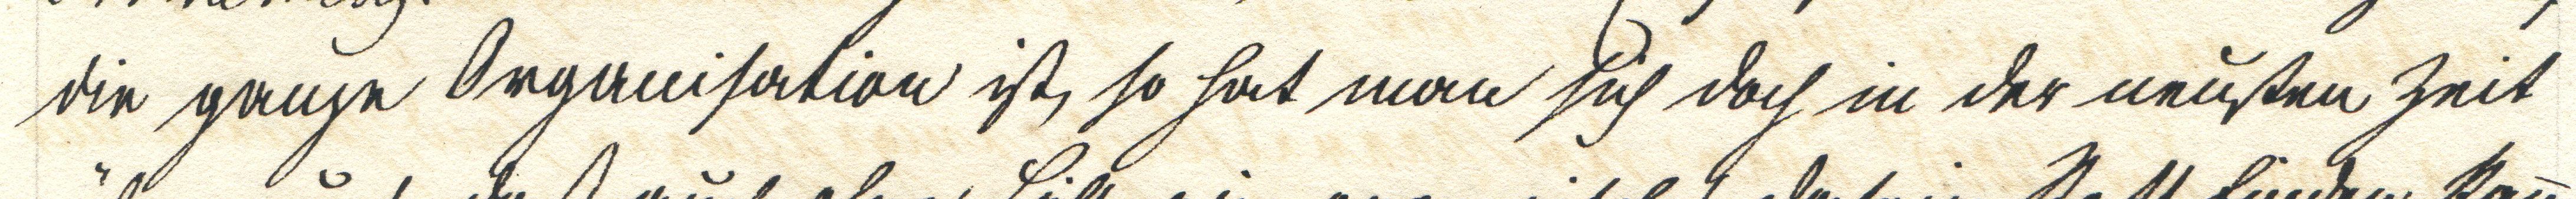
die ganze Organisation ist, so hat man sich doch in der neusten Zeit
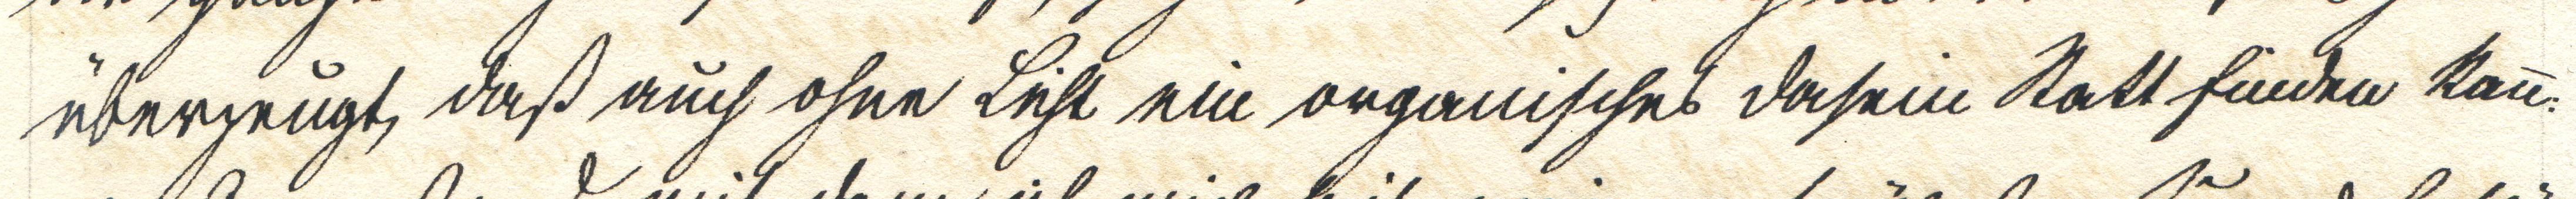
überzeugt, daß auch ohne Licht ein organisches Dasein statt finden kañ:
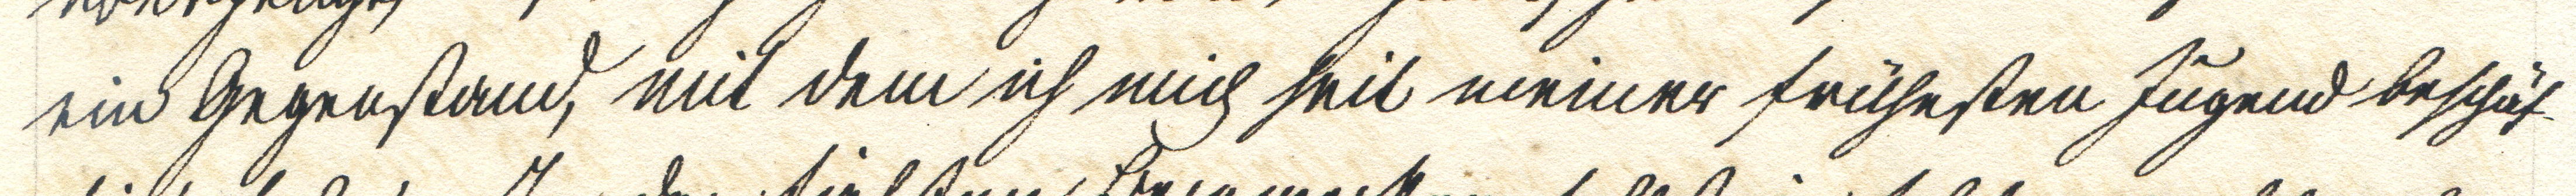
ein Gegenstand, mit dem ich mich seit meiner frühesten Jugend beschäf-
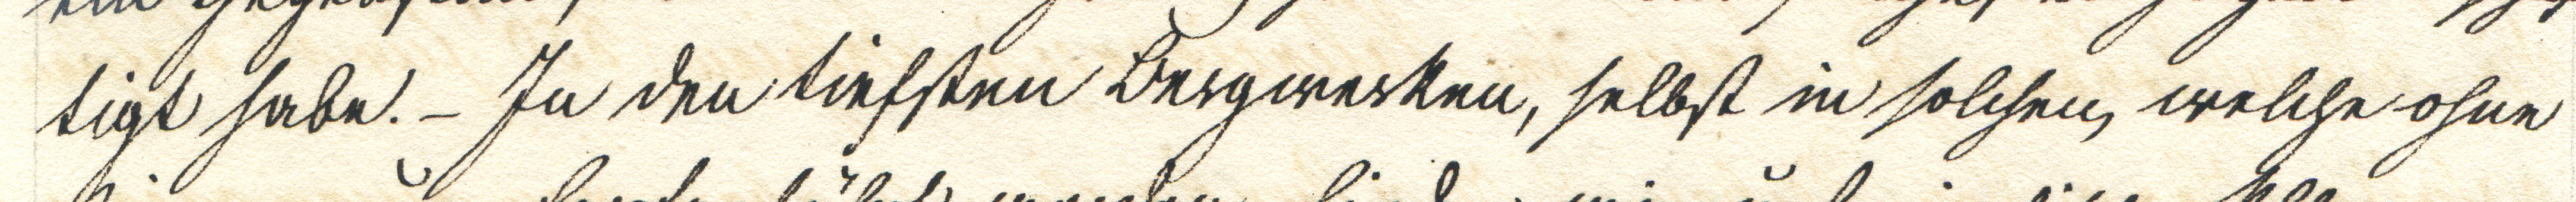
tigt habe. – In den tiefsten Bergwerken, selbst in solchen, welche ohne
